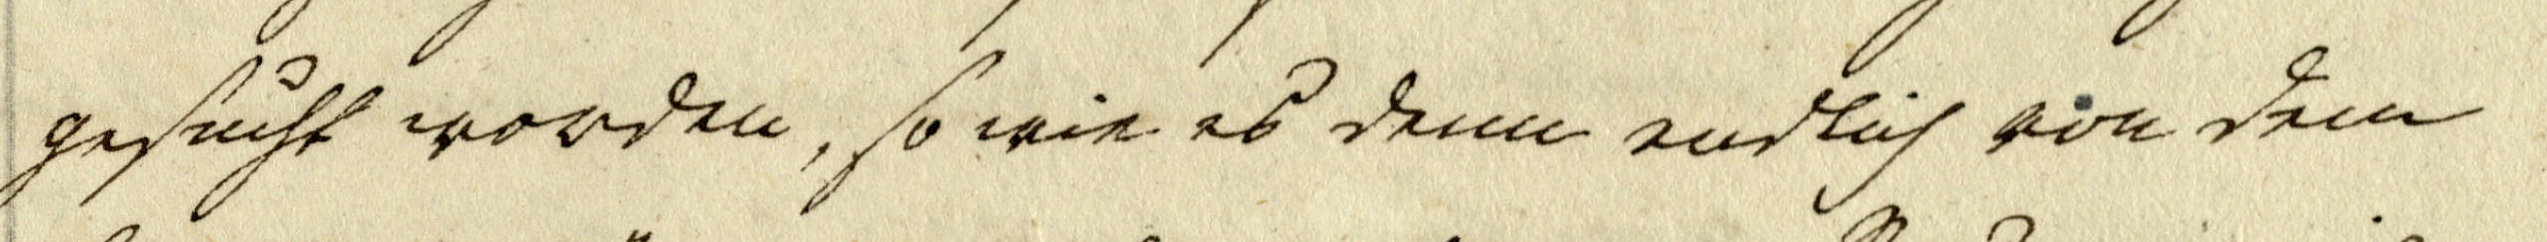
gesucht worden, so wie es denn endlich von dem
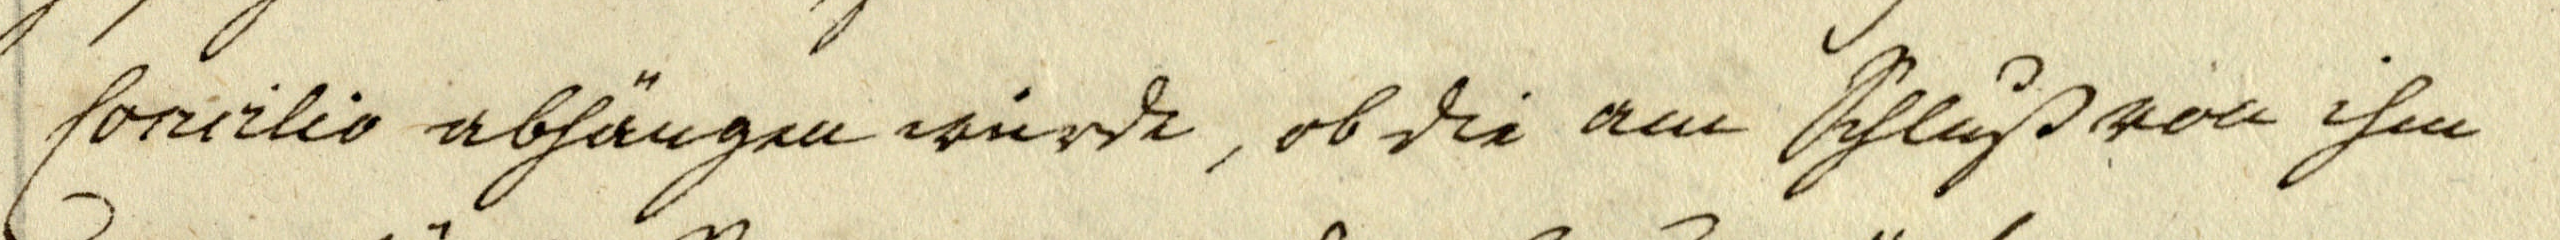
Concilio abhängen würde, ob die am Schluß von ihm
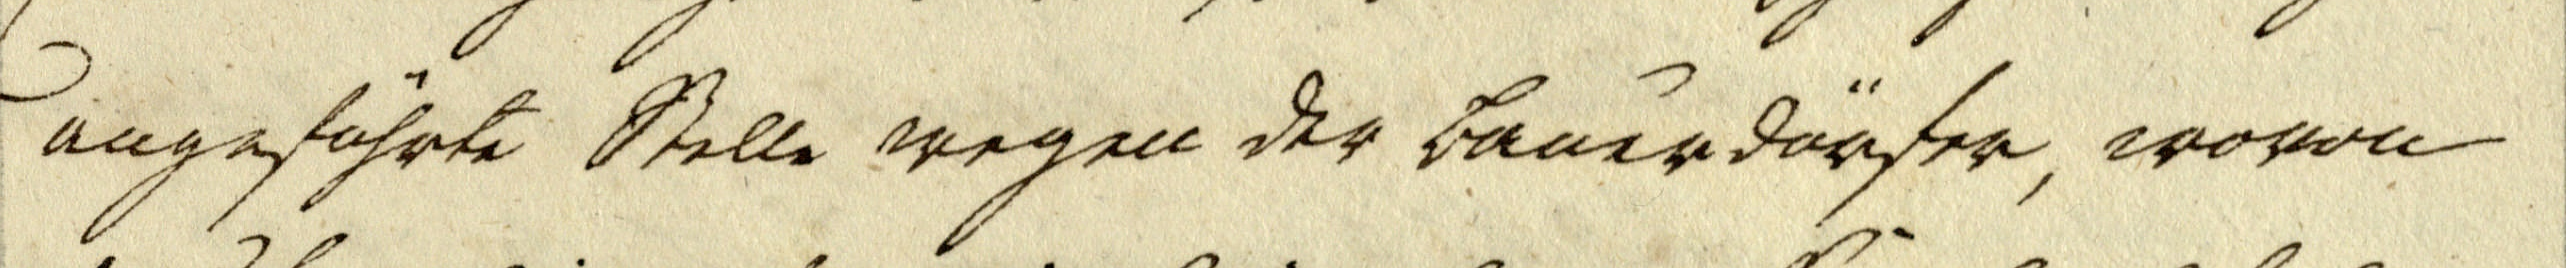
angeführte Stelle wegen der Bauerdörfer, wovon
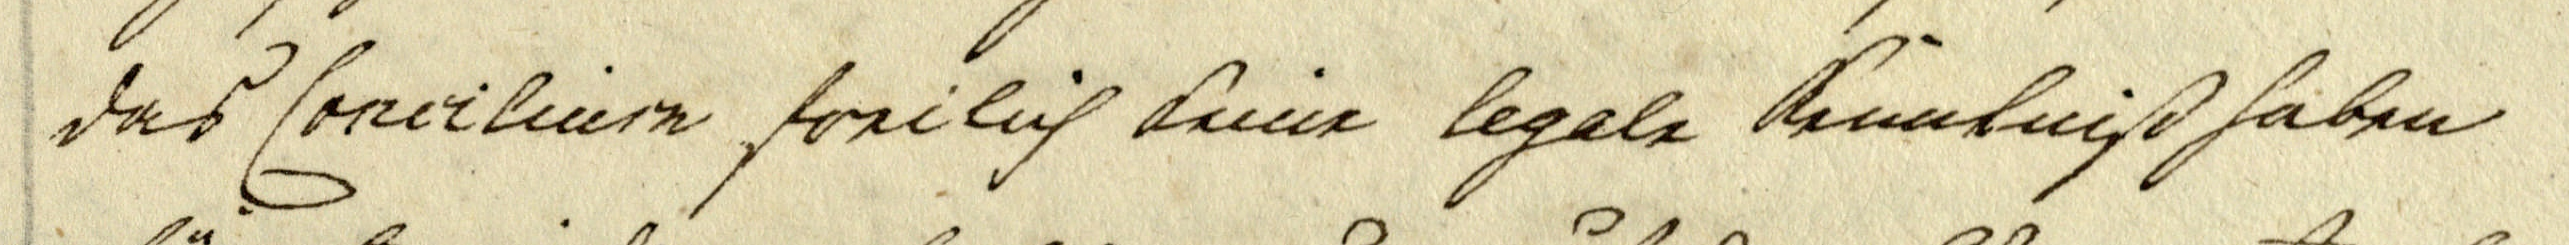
das Concilium freilich keine legale Kenntniß haben
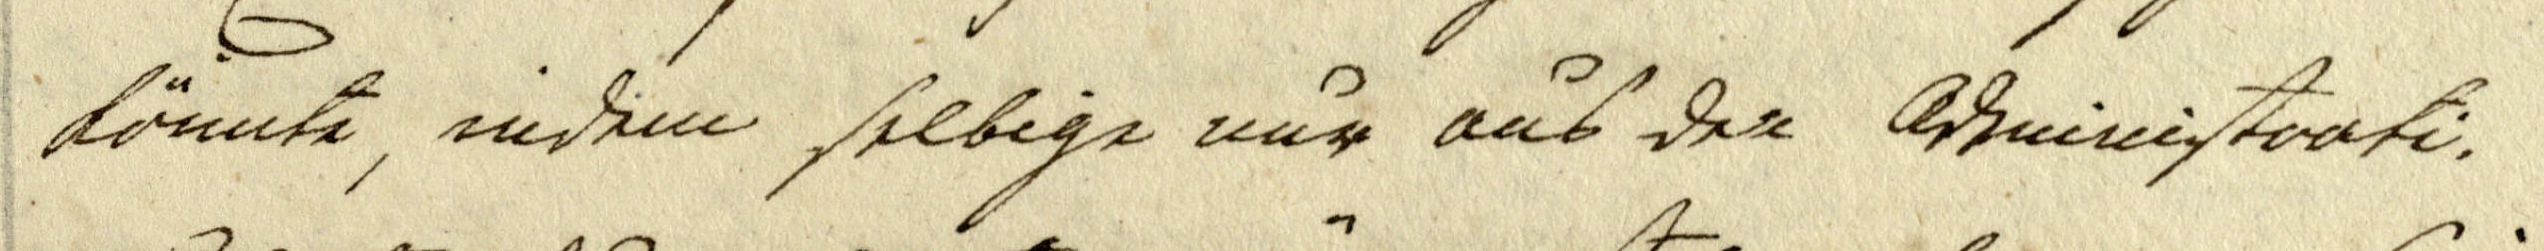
könnte, indem selbige nur aus den Administrati¬
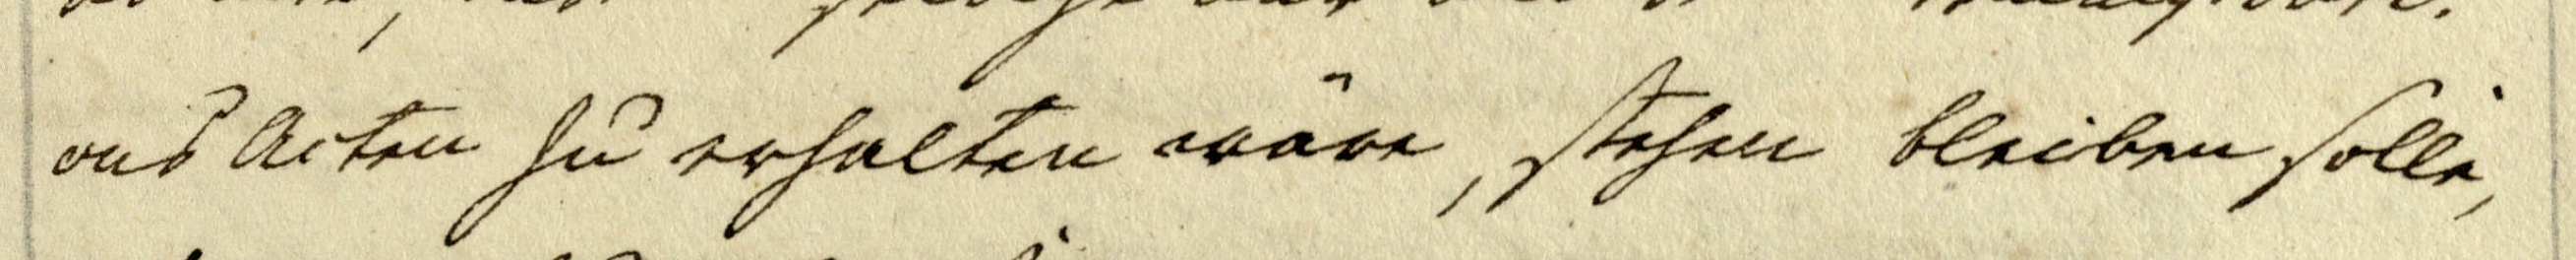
ons Acten zu erhalten wäre, stehen bleiben solle
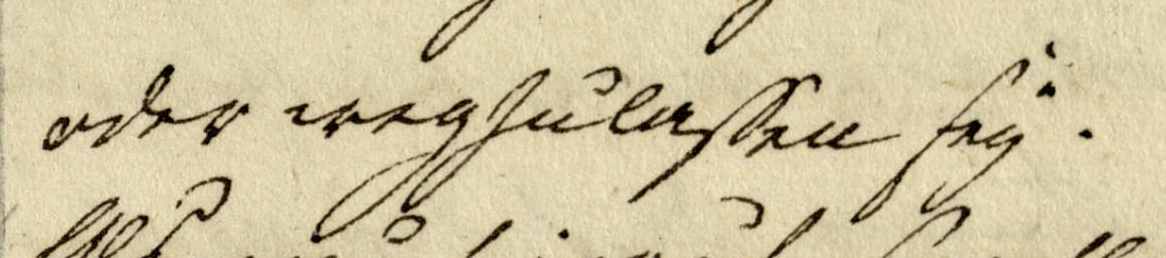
oder wegzulassen seÿ.
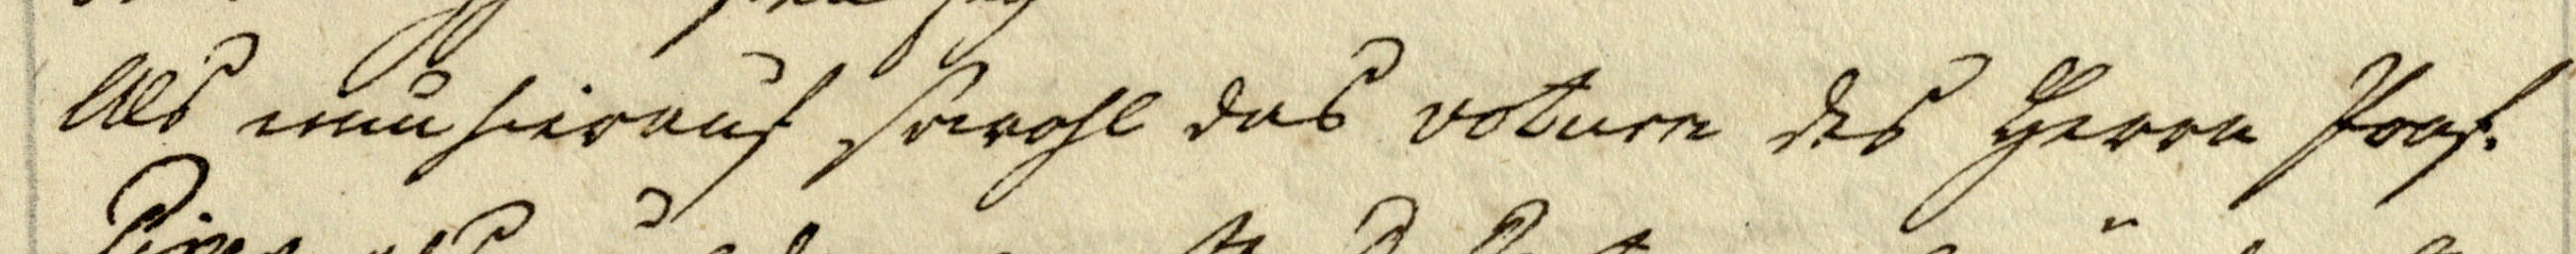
Als nun hierauf sowohl das votum des Herrn Prof.
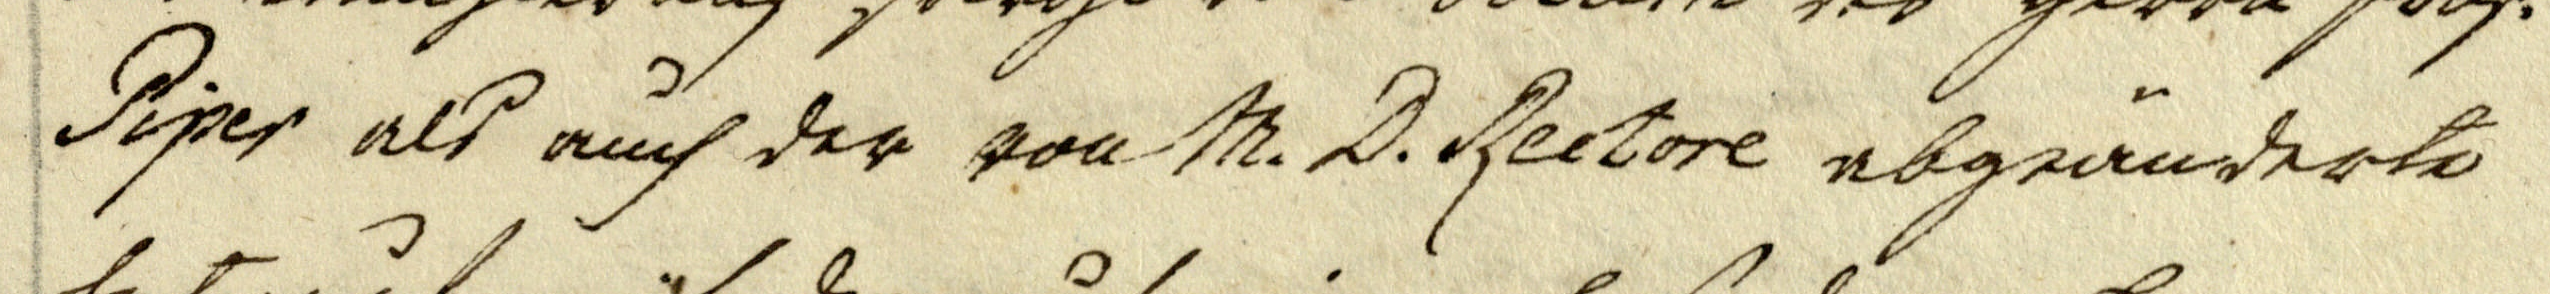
Piper als auch der von M. D. Rectore abgeänderte
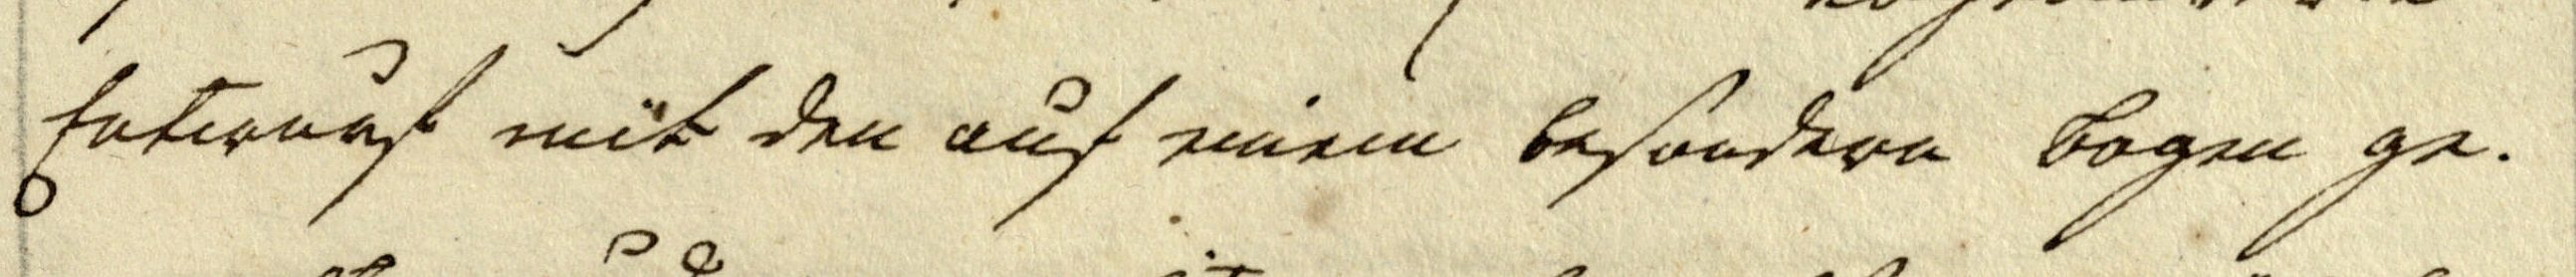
Entwurf mit den auf einem besondern Bogen ge¬
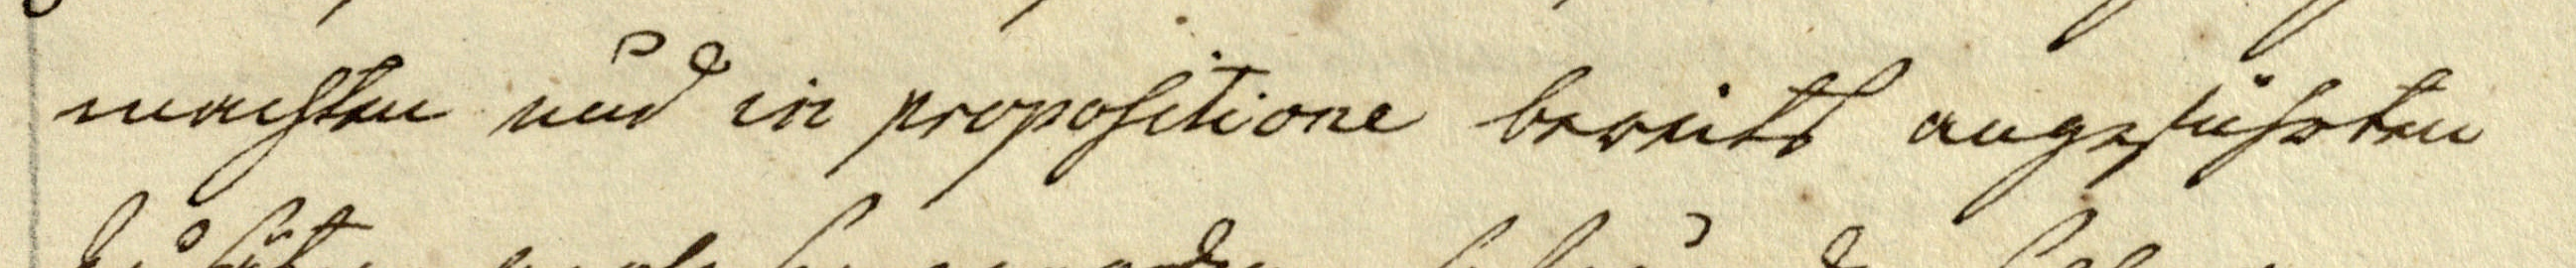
machten und in propositione bereits angeführten
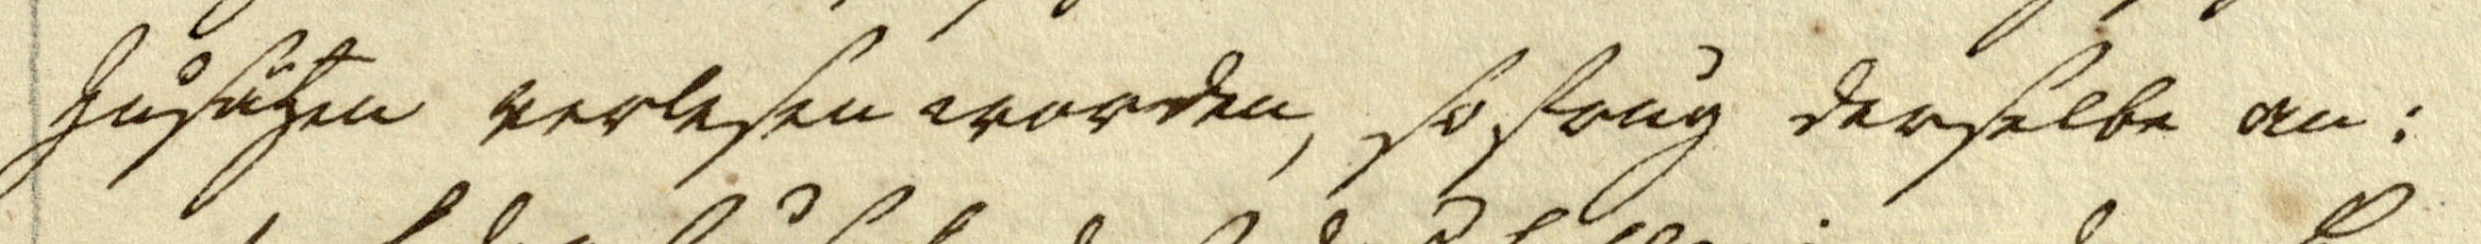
Zusätzen verlesen worden, so frug derselbe an:
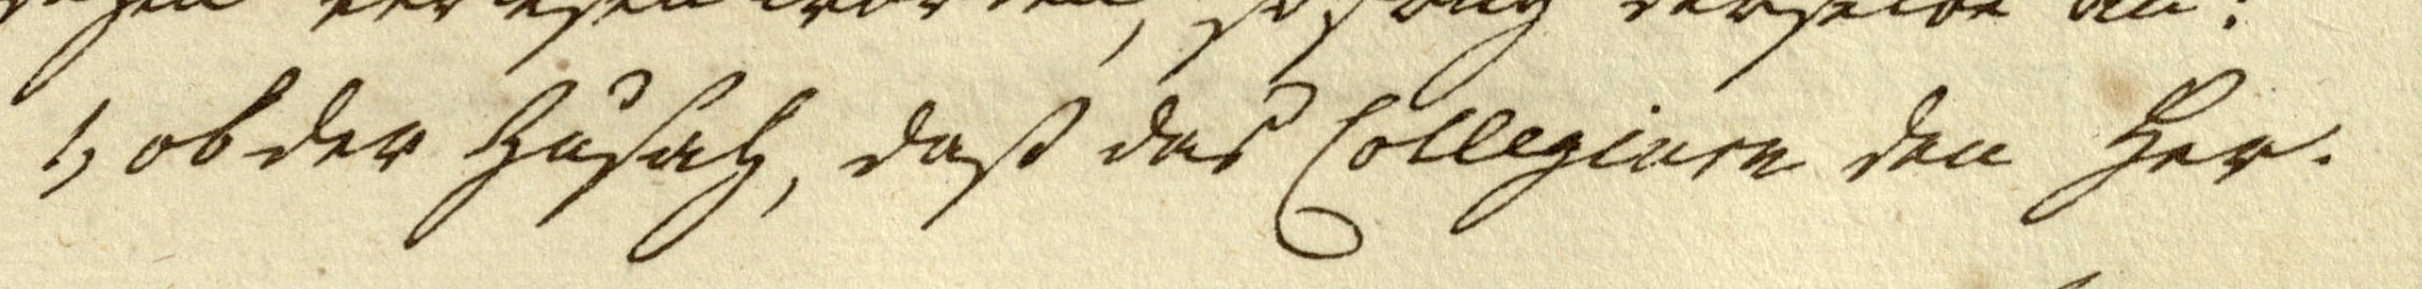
1, ob der Zusatz, daß das Collegium den Her¬
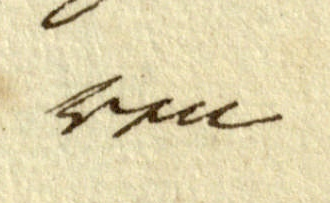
ren
